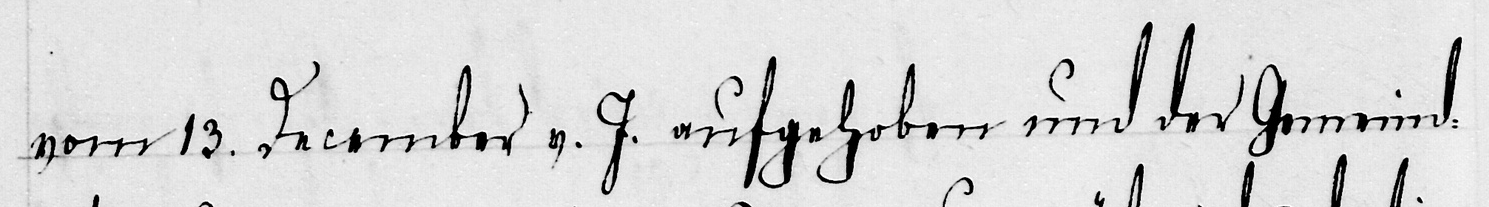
vom 13. December v. J. aufgehoben und der Gemeind¬
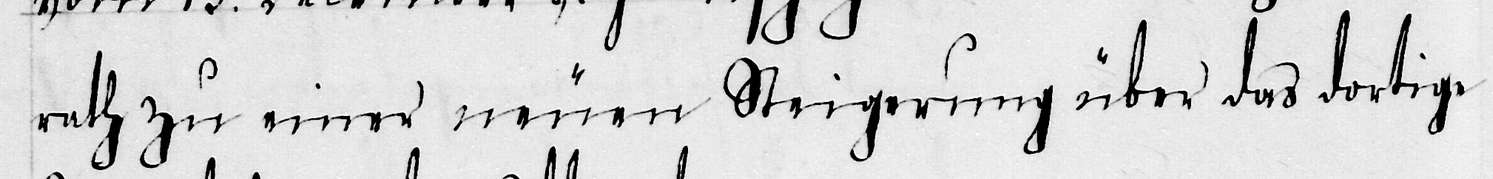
rath zu einer neuen Steigerung über das dortige
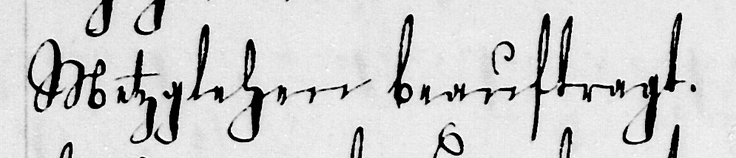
Metzglehen beauftragt.
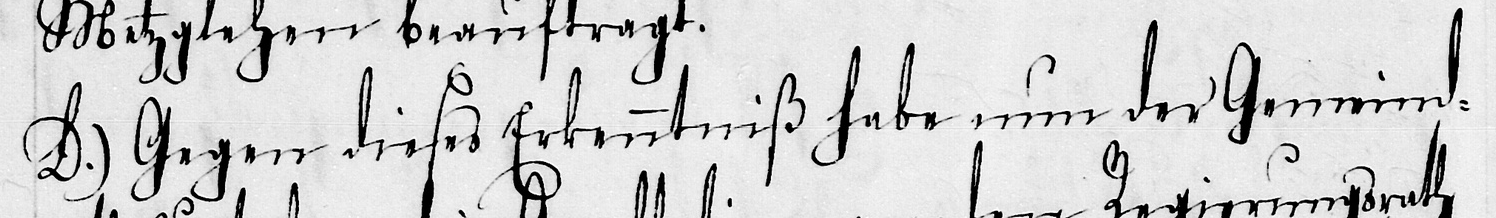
D.) Gegen dieses Erkenntniß habe nun der Gemeind¬
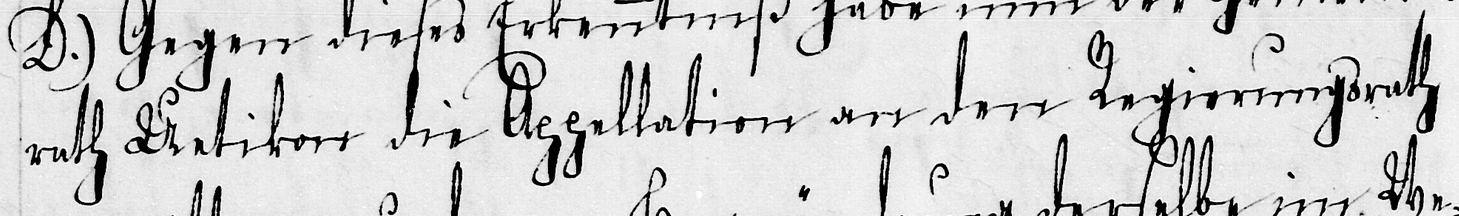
rath Uetikon die Appellation an den Regierungsrath
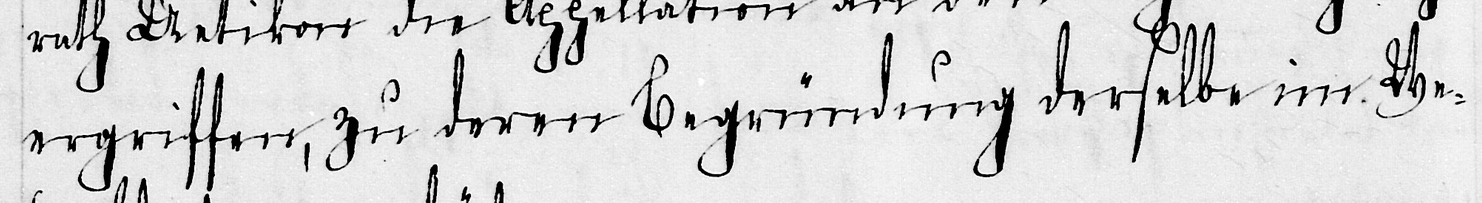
ergriffen, zu deren Begründung derselbe im We¬
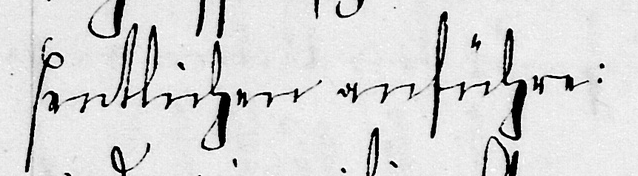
sentlichen anführe:
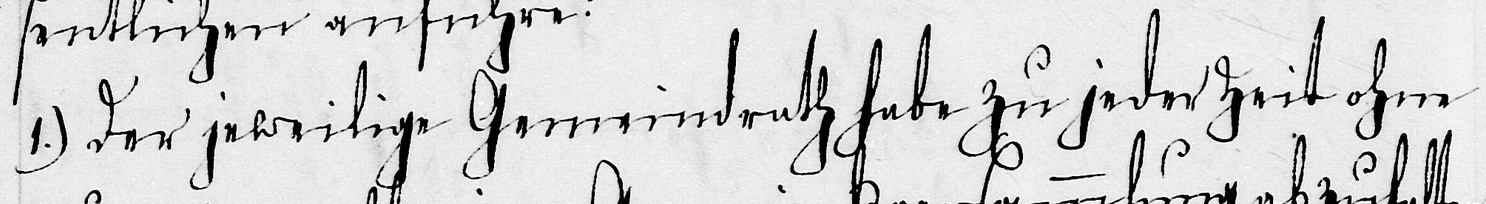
1.) Der jeweilige Gemeindrath habe zu jeder Zeit ohne
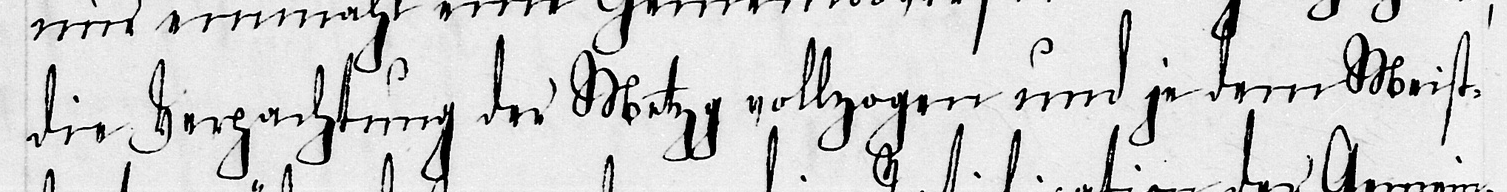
die Verpachtung der Metzg vollzogen und je dem Meist¬
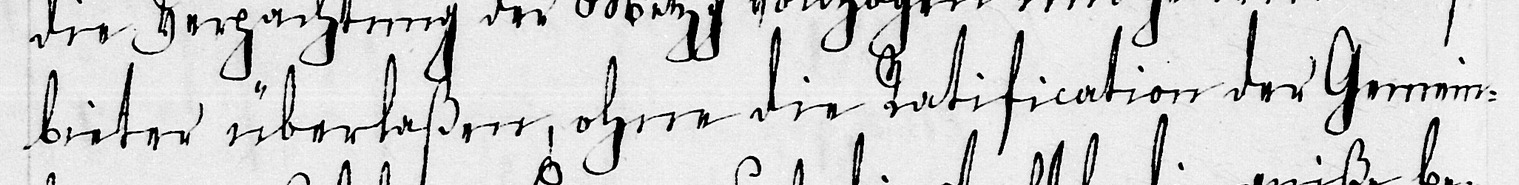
bieter überlaßen, ohne die Ratification der Gemein¬
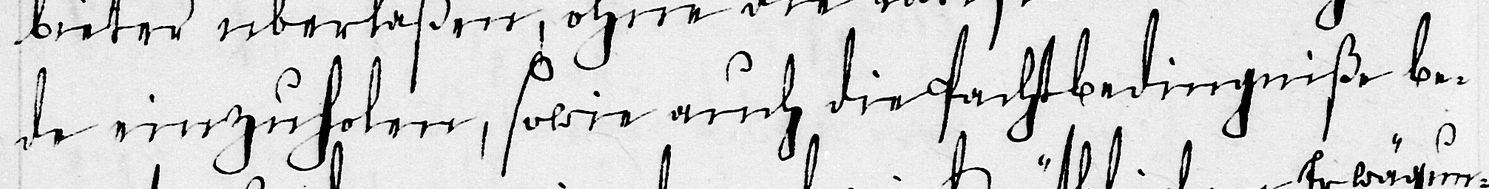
de einzuholen, sowie auch die Pachtbedingniße be¬
